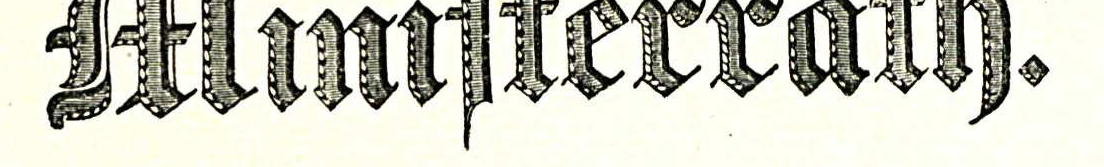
Ministerrath.
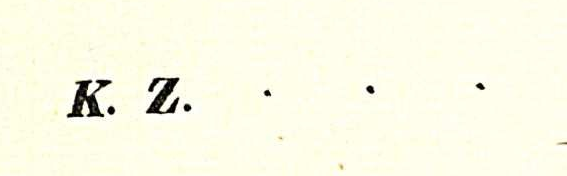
K.Z. ...
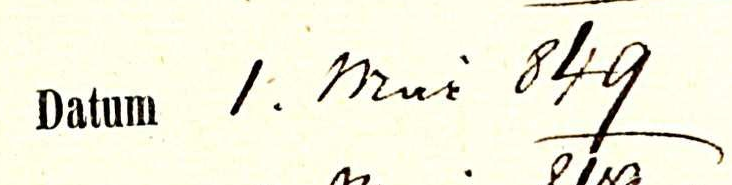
Datum 1. Mai 849
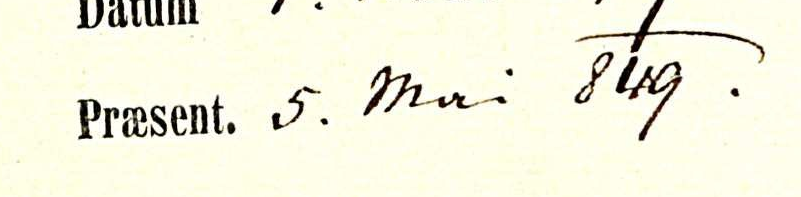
Præsent. 5. Mai 849.
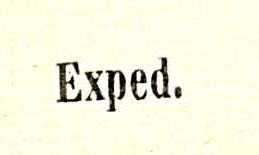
Exped.
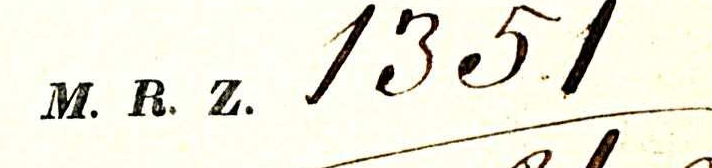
M. R. Z. 1351
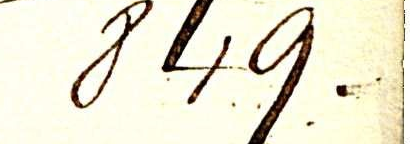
849.
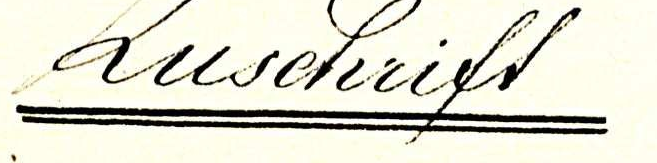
Luschrift
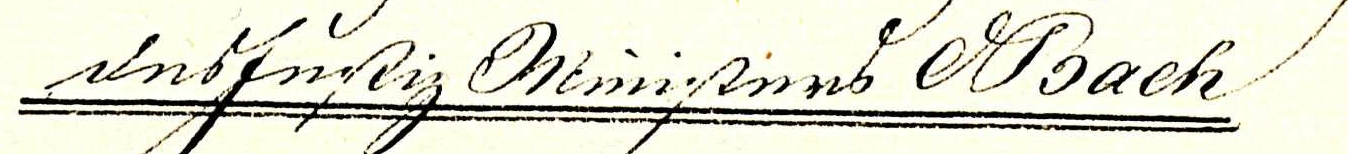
Des Justiz Ministers Bach
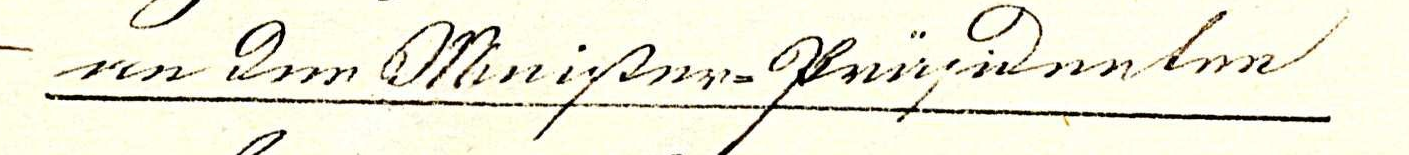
an den Minister-Präsidenten
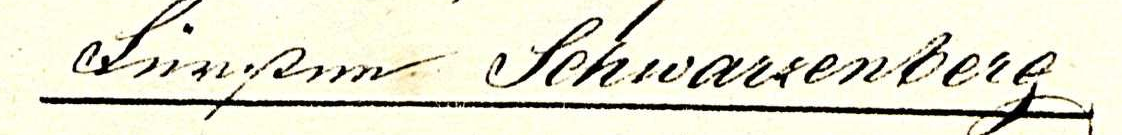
Fürsten Schwarzenberg
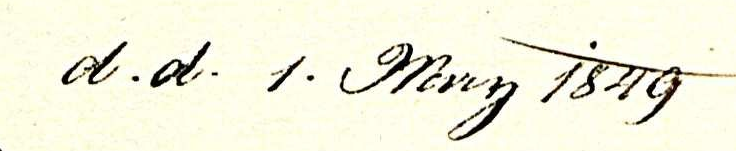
d.d. 1. May 1849
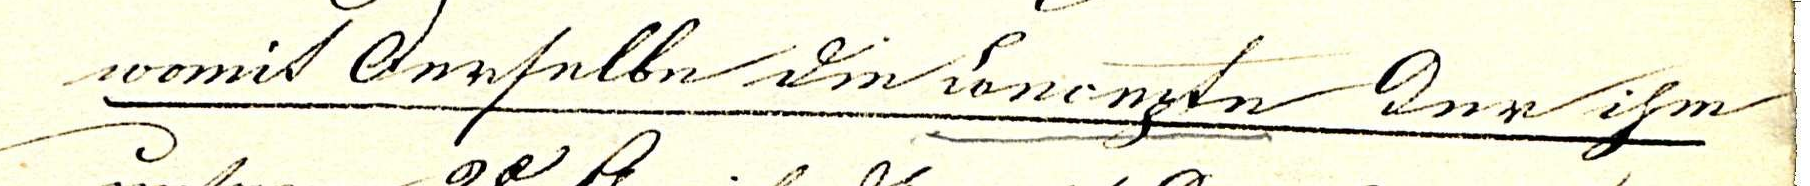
womit derselbe die Concepte der im
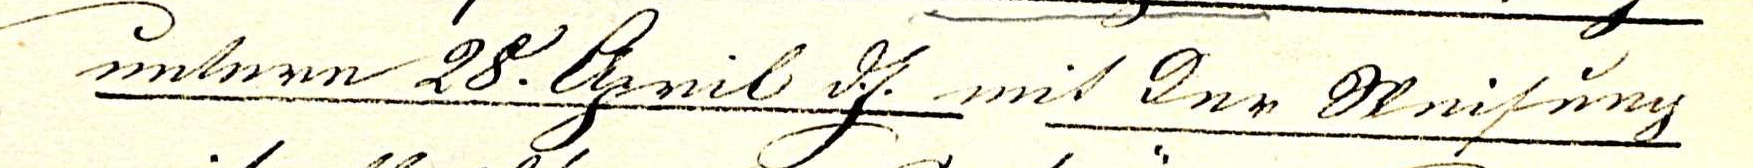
untere 28. April xx mit der Weisung
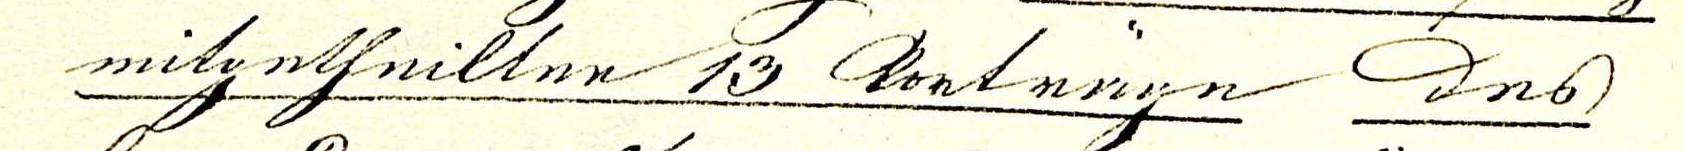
mitgetheilten 13 Vorträge des
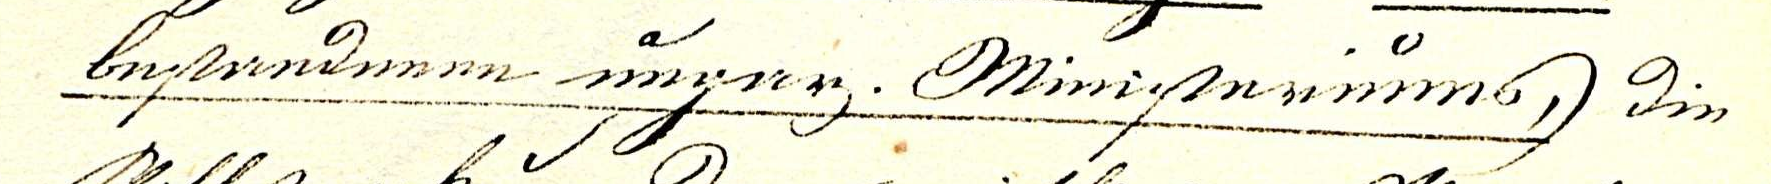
bestandenen ungar. Ministeriums, die
